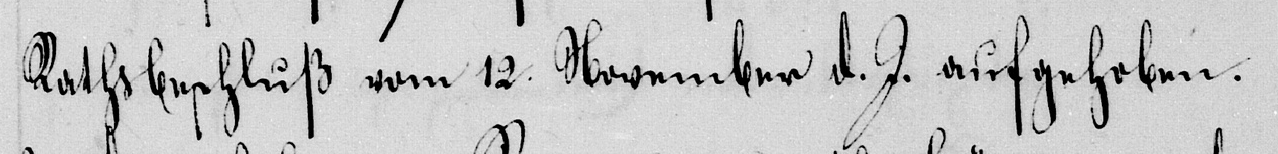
Rathsbeschluß vom 12. November d. J. aufgehoben.
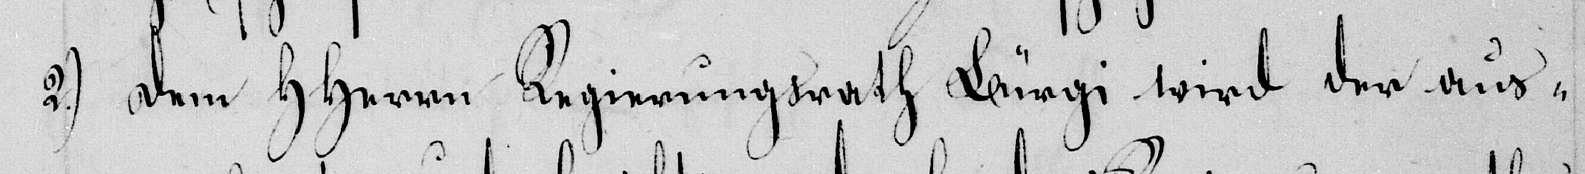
2.) Dem HHerrn Regierungsrath Bürgi wird der aus¬
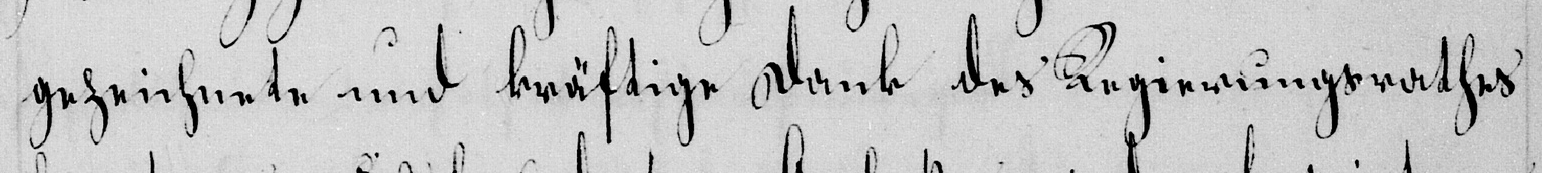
gezeichnete und kräftige Dank des Regierungsrathes
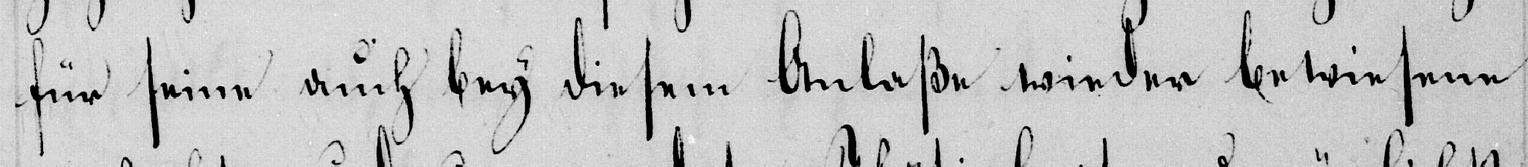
für seine auch bey diesem Anlaße wieder bewiesene
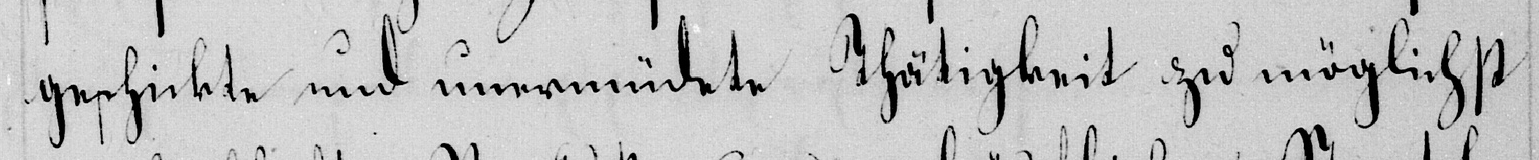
geschickte und unermüdete Thätigkeit zu möglichst
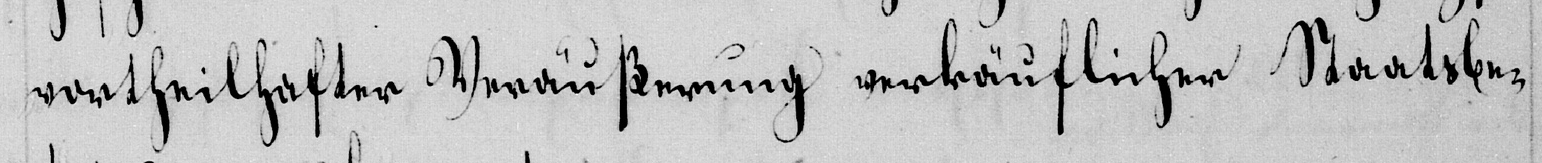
vortheilhafter Veräußerung verkäuflicher Staatsbe¬
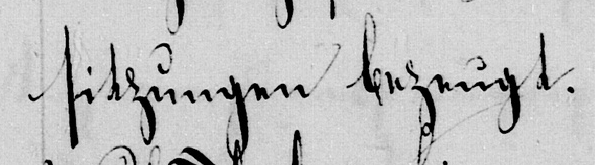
sitzungen bezeugt.
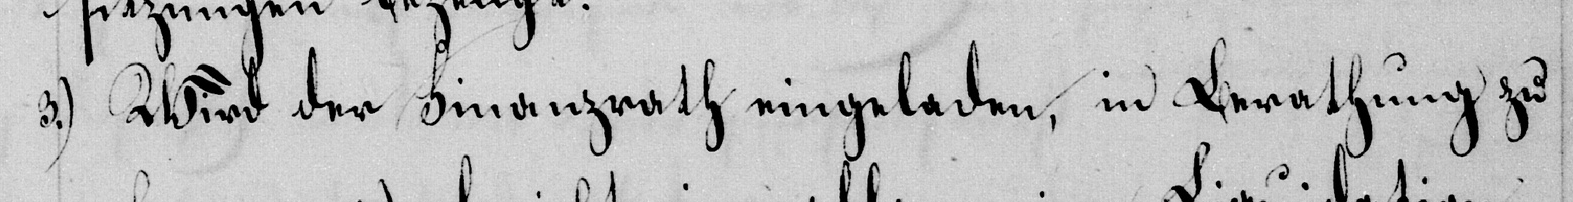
3.) Wird der Finanzrath eingeladen, in Berathung zu
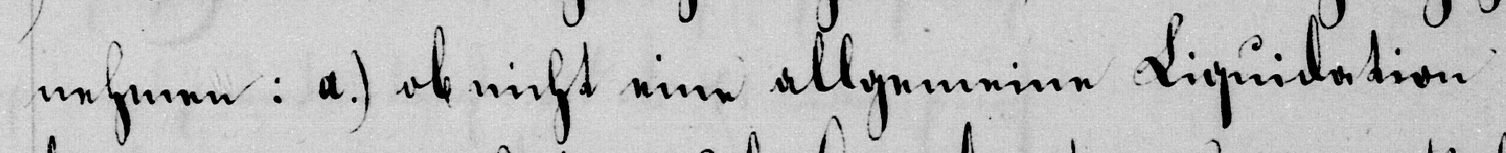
nehmen: a.) ob nicht eine allgemeine Liquidation
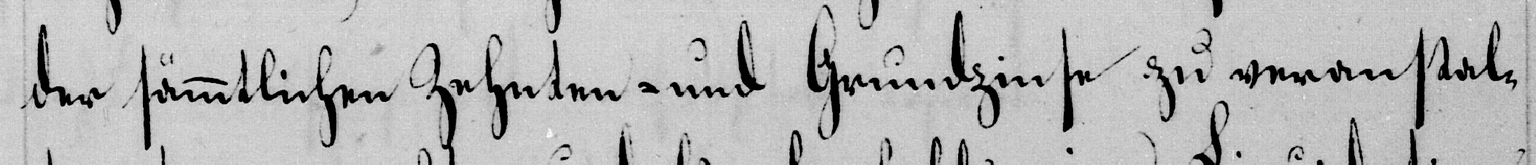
der sämmtlichen Zehnten- und Grundzinse zu veranstal¬
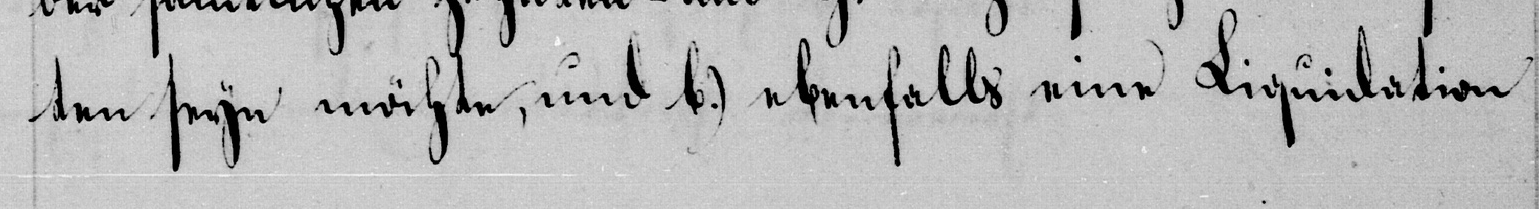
ten seyn möchte, und b.) ebenfalls eine Liquidation
